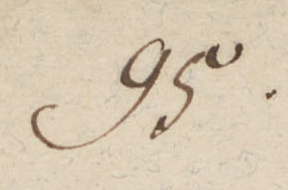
95.
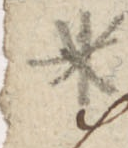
die
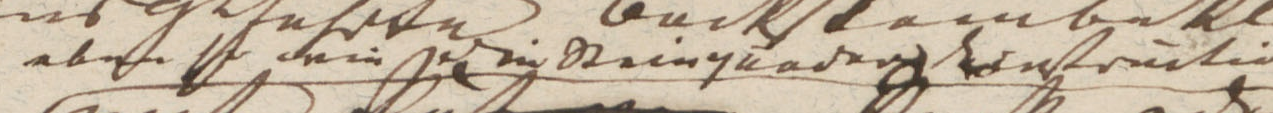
eben so wie die Steinquaderkonstruction
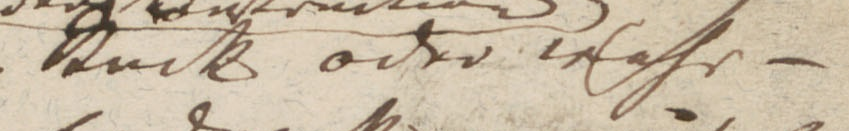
Stuck oder wahr-
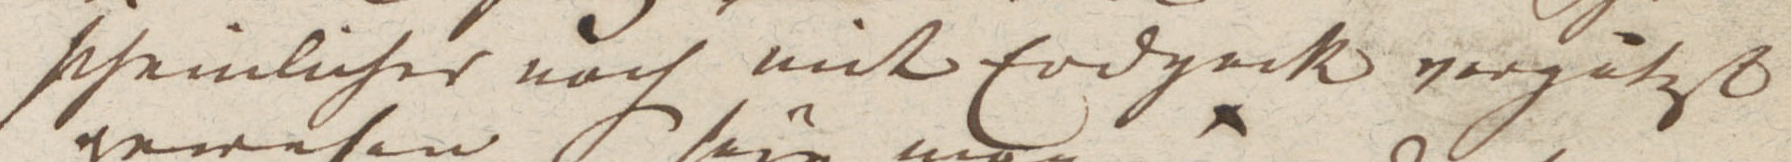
scheinlicher noch mit Erdpeck verputzt
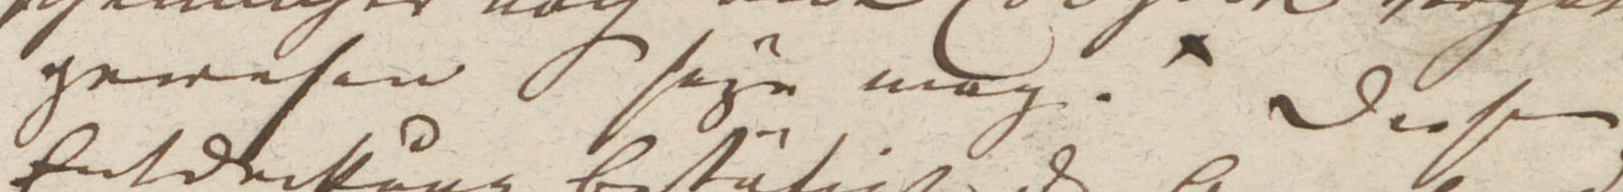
gewesen seyn mag. % Diese
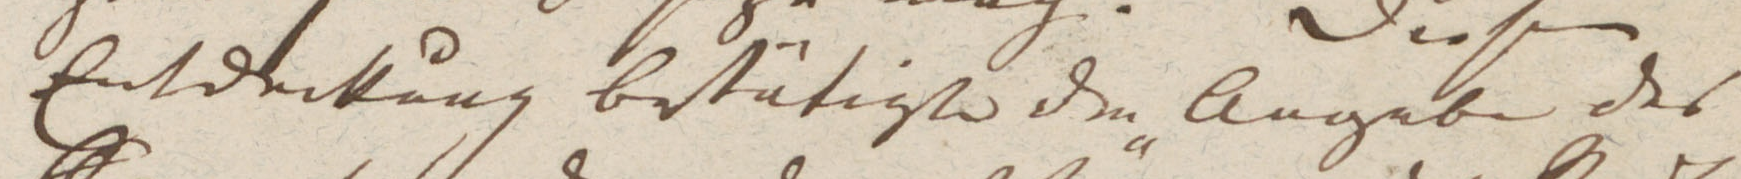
Entdeckung bestätigt die Angabe des
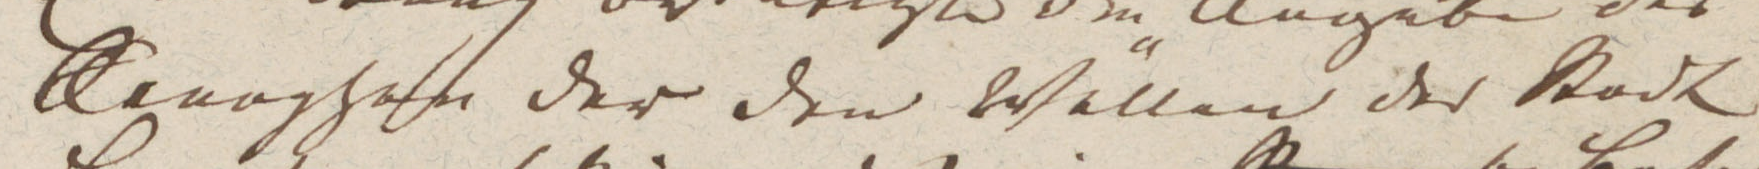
Xenophon der den Wällen der Stadt
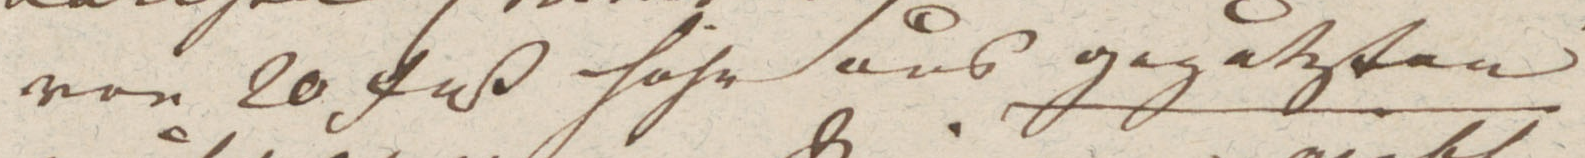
von 20 Fuss Höhe aus geputzten
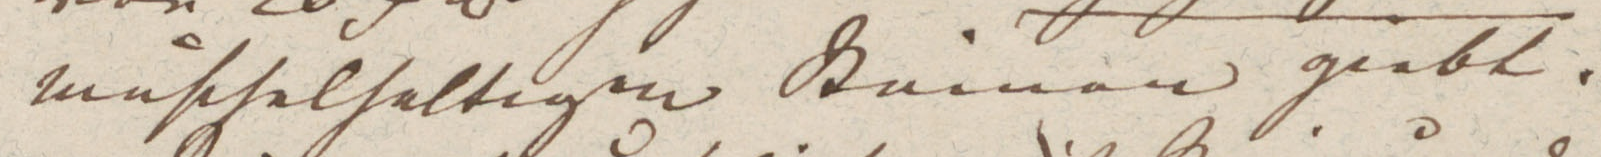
muschelhaltigen Steinen giebt.
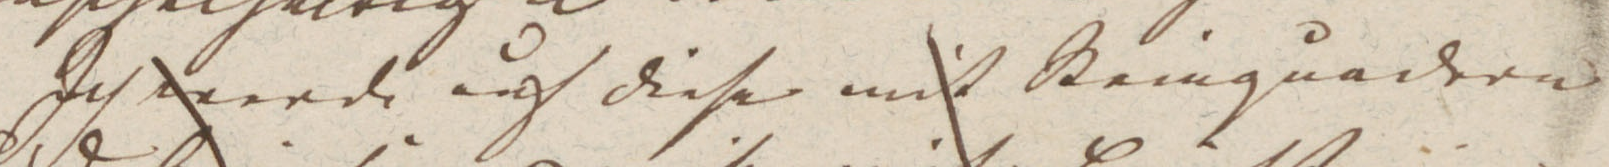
Ich werde auf diese mit Steinquadern
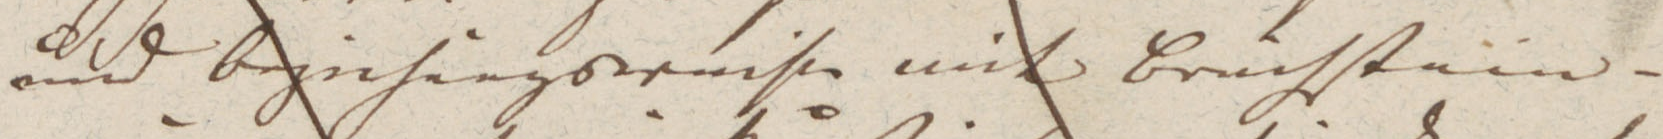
und beziehungsweise mit Bruchstein-
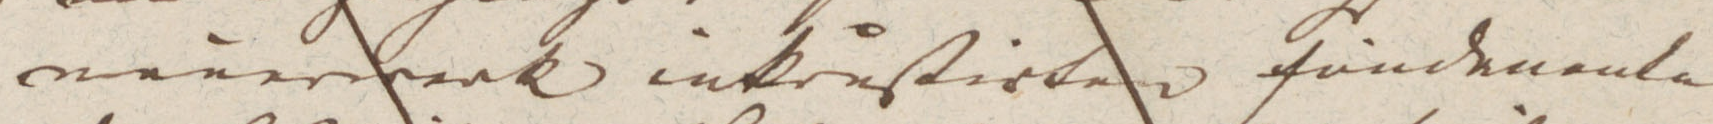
mauerwerk inkrustirten Fundamente
